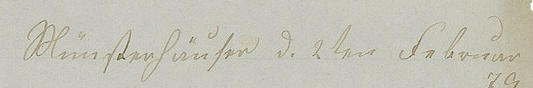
Münsterhäuser d. 2ten Februar
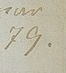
79.
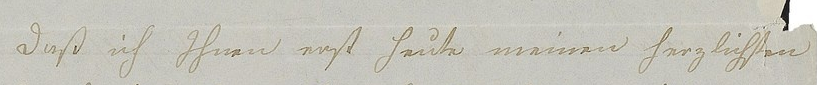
Daß ich Ihnen erst heute meinen herzlichsten
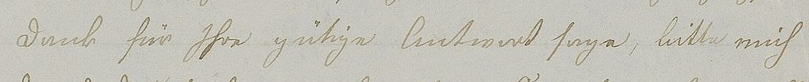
Dank für Ihre gütige Antwort sage, bitte mich
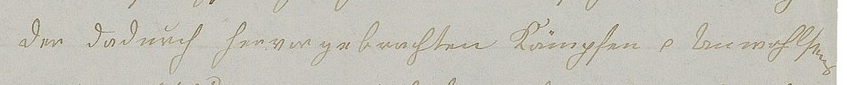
der dadurch hervorgebrachten Kämpfen & Unwohlseins
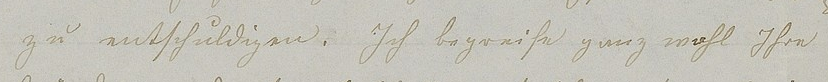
zu entschuldigen. Ich begreife ganz wohl Ihre
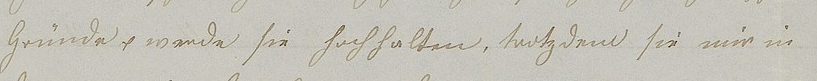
Gründe & werde sie hochhalten, trotzdem sie mir in
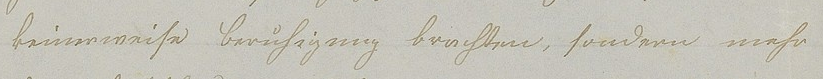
keinerweise Beruhigung brachten, sondern mehr
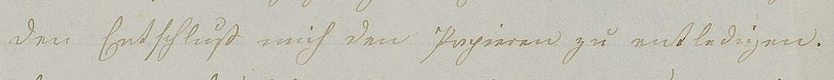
den Entschluß mich den Papieren zu entledigen.
